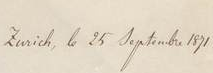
Zurich, le 25 Septembre 1871
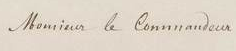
Monsieur le Commandeur
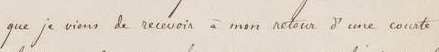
que je viens de recevoir à mon retour d'une courte
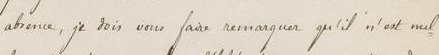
absence, je dois vous faire remarquer qu'il n'est nul-
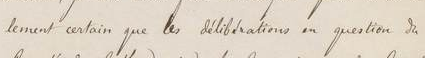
lement certain que les délibérations en question du
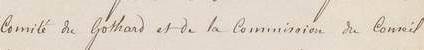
Comité du Gothard et de la Commission du Conseil
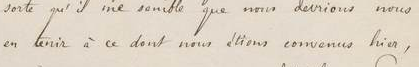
en tenir à ce dont nous étions convenus hier,
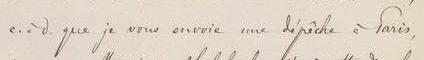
c. à d. que je vous envoie une dépêche à Paris,
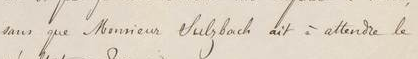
sans que Monsieur Sulzbach ait à attendre le
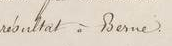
résultat à Berne.
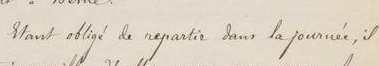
Etant obligé de repartir dans la journée, il
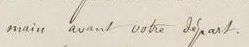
main avant votre départ.
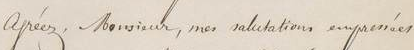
Agréez, Monsieur, mes salutations empressées
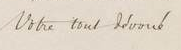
Monsieur le Commandeur
